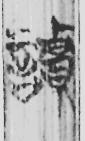䜋
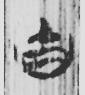由
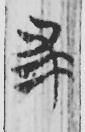求
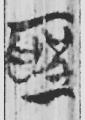聖
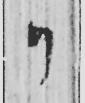人
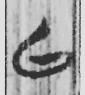㠯（以）
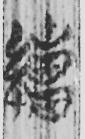{糸東田}
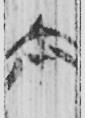尔
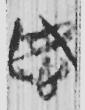悔（謀）
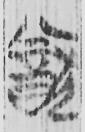猶
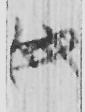母
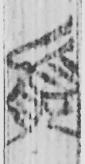{肉頁}
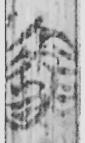䎽
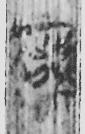䌛
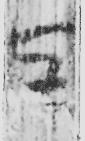厇
